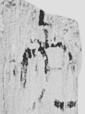京（諒）
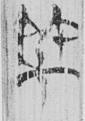竿
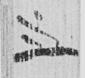之
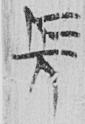長
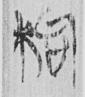枸
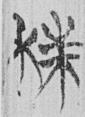株
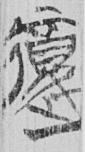○（覆）
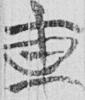車
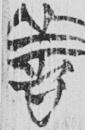善
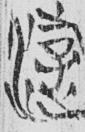游
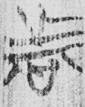者
